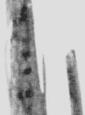爲
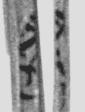{臼亓}（斯）
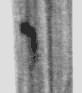人
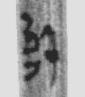信
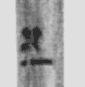之
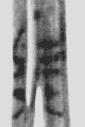矣
